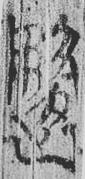○（降）
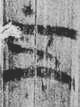五
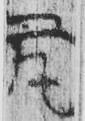厇（度）
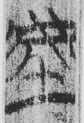○（吾）
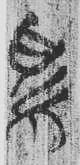○（奚）
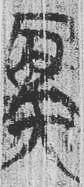○（衡）
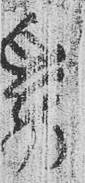○（奚）
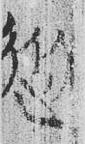從（縱）
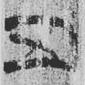五
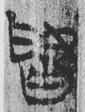既（氣）
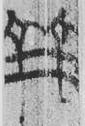竝
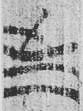至
